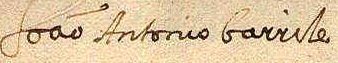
Joaõ Antonio barrile
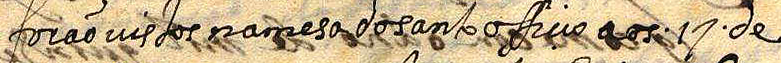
foraõ uistos na mesa do santo officio aos .17. de
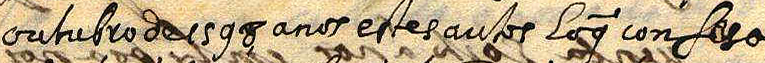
outubro de 1598 anos estes autos E o q̄ confesa
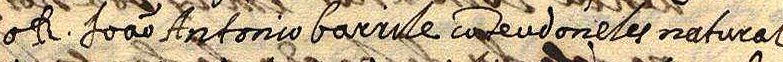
o R. Joaõ Antonio barrile cōteudo neles natural
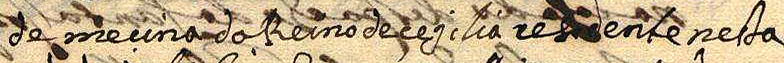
de meçina do Reino de çejilia residente nesta
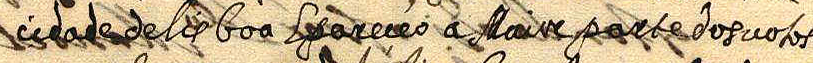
cidade de lisboa E pareçeo a Maior parte dos uotos
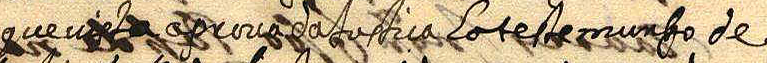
que uista a proua da Justica ho testemunho de
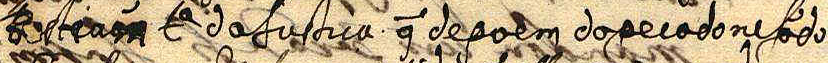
B_stiam ta da Justica q̄ depoem do pecado nefādo
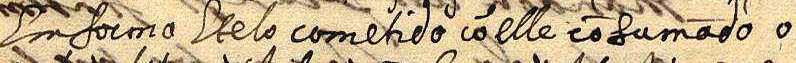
Em forma E telo cometido cō elle cōsumādo o
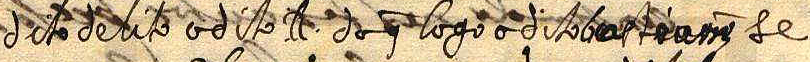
dito delito o dito R. do q̄ logo o dito bastiam se
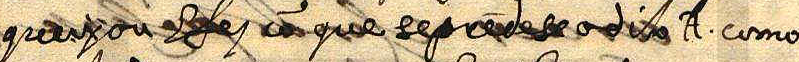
queixou E fes cō que se prēdese o dito R. como
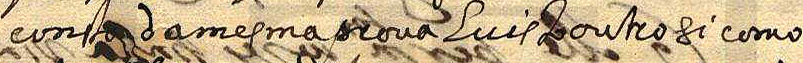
consta da mesma proua E uisto outrosi como
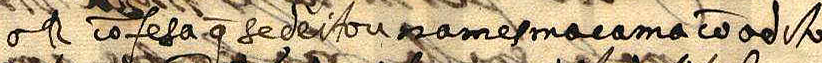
o R cōfesa q̄ se deitou na mesma cama cō o dito
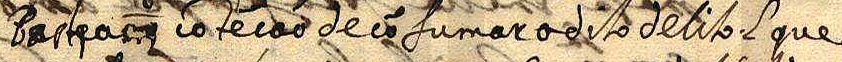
Bastiam cō tēçaõ de cōsumar o dito delito. E que
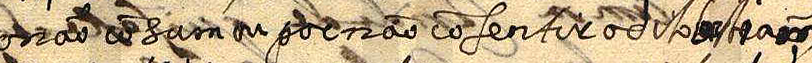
o naõ cōsumou por não cōsentir o dito bastiam
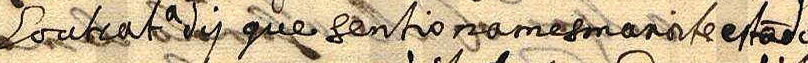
E outra ta dis que sentio na mesma noite estādo
